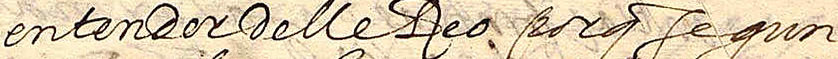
entender delle Reo porq̄ segun
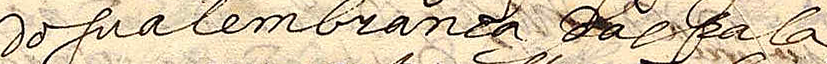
do sua lembrança das pala
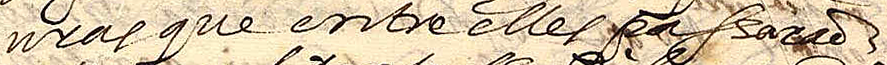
uras que entre elles passaraõ
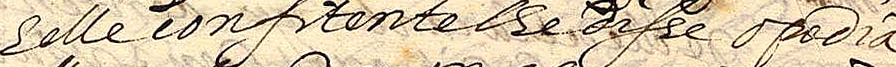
E elle confitente lhe disse o podia
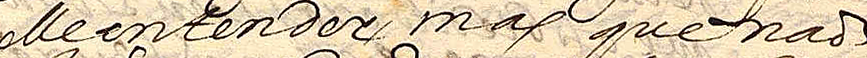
elle entender, mas que naõ
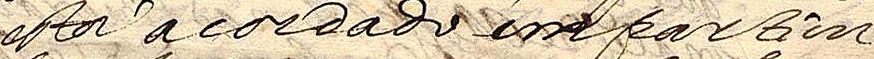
está acordado em particu
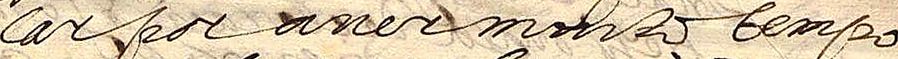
lar por auer muito tempo
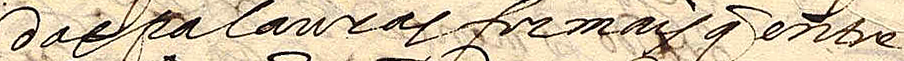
das palauras formais q̄ entre
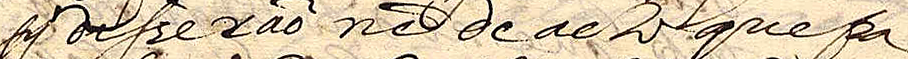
sy disseraõ nē de acto que pa
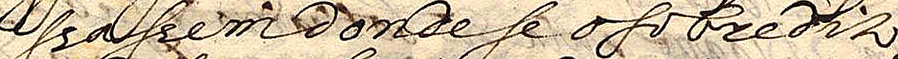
ssassem donde se o sobredito
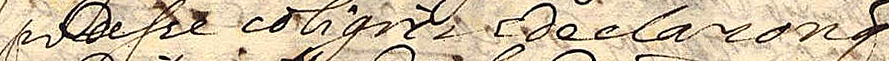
podesse coligir E declarou q̄
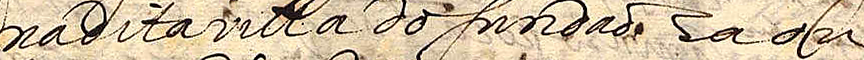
na dita villa do fundaõ ha ou
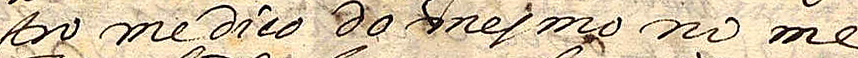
tro medico do mesmo nome
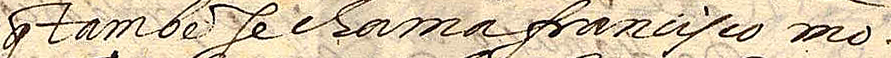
q̄ tambē se chama francisco mo
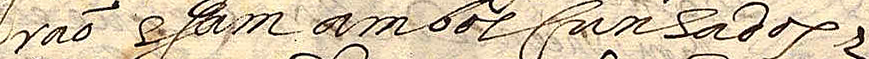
raõ E sam ambos Cunhados E
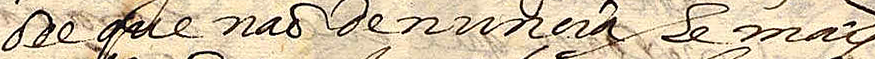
o de que naõ denunçia he mais
